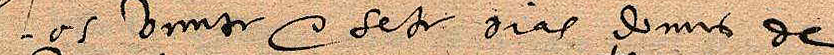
Aos vimte e sete dias do mes de
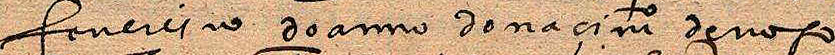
feuereiro do anno do naçimto de noso
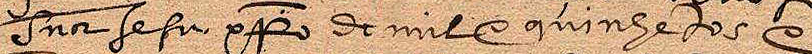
S̄nor Jesu xp̄o de mil e quinhetos e
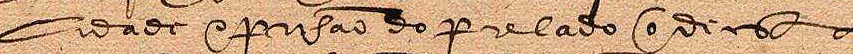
Cidade e prisão do prelado ōde esta
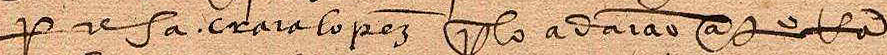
presa .crara lopez p̄lo adaião āto Rā
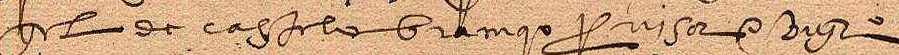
gel de castelo bramqo ꝓujsor e vigro
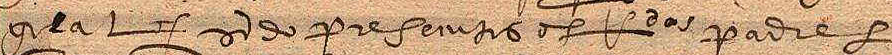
geraL cꝭ sēdo presemtes os Rdos padres
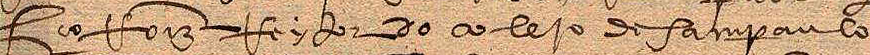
frco Rōiz Reytor do colejo de sam paulo
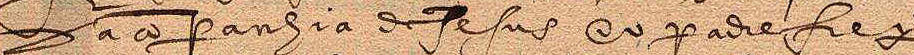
Da c̄opanhia de Jesus e o padre frey
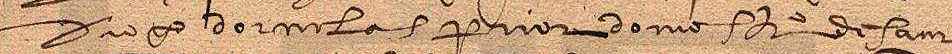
Diogo dornelas prior do mostro de sam
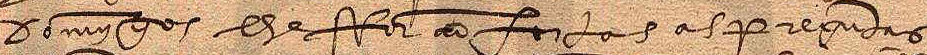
Dom̄ygos lhe fforão feitas as pregūtas
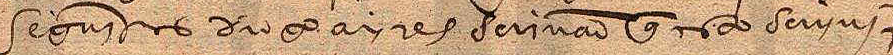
segūjtes diogo ayres scriuão q̄ esto scryuj
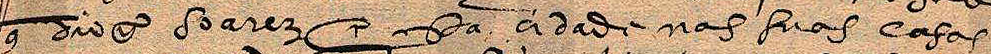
q̄ diogo soarez ē esta çidade nas suas casas
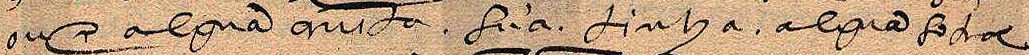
ou ē alguā qūita sua tinha alguā sotea
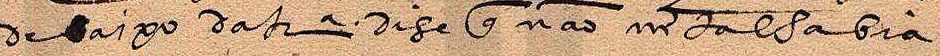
debaixo da tra dise q̄ não nē tal sabia
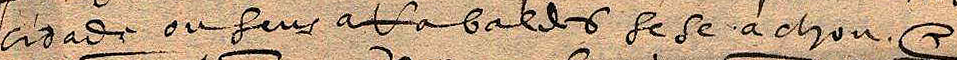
cidade ou seus aRabaldes se se achou ē
